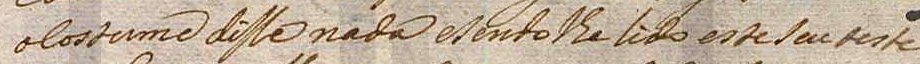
o Costume disse nada e sendolhe lido este seu teste
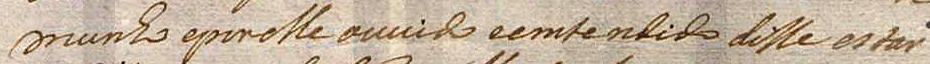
munho e por elle ouuido e emtendido disse estar
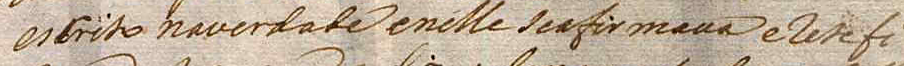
esCrito na verdade e nelle se afirmaua e Retefi
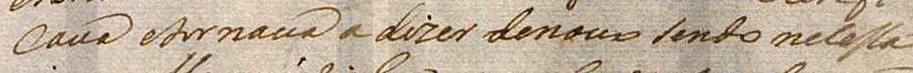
Caua e tornaua a dizer de nouo sendo necessa
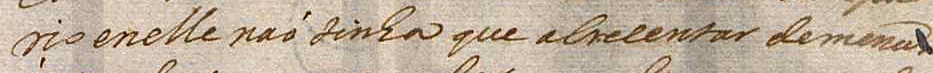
rio e nelle naõ tinha que aCrecentar demenu
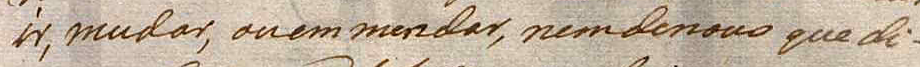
ir, mudar, ou emmendar, nem de nouo que di
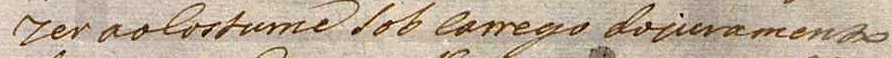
Zer ao costume sob carrego do iuramento
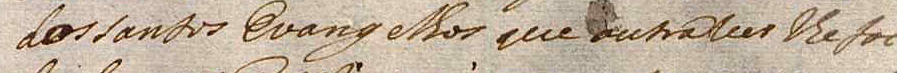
dos santos Evangelhos que outra ves lhe foi
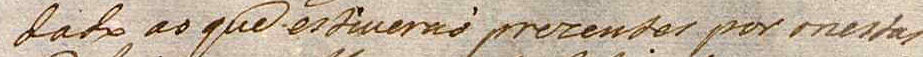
dado ao que estiueraõ prezentes por onestas
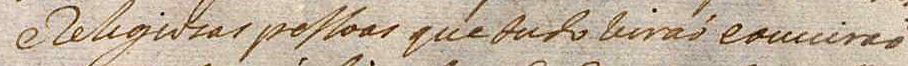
e Religiozas pessoas que tudo viraõ e ouuiraõ
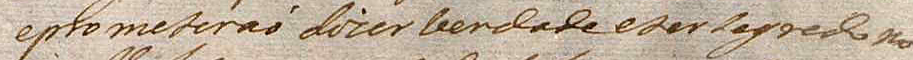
e prometeraõ dizer verdade e ter segredo no
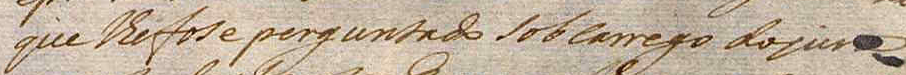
que lhe fose perguntado sob carrego do jur
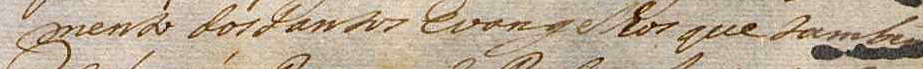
mento dos santos Evangelhos que tambe
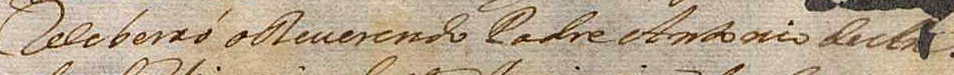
Receberaõ o Reuerendo Padre Antonio de An
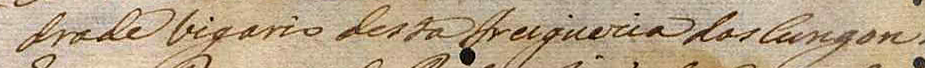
drade Vigario desta freiguezia dos Cungon
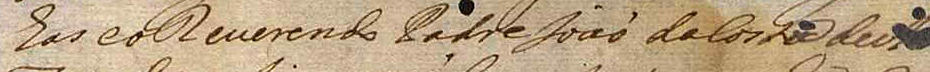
has e o Reuerendo Padre Joaõ da Costa de A
